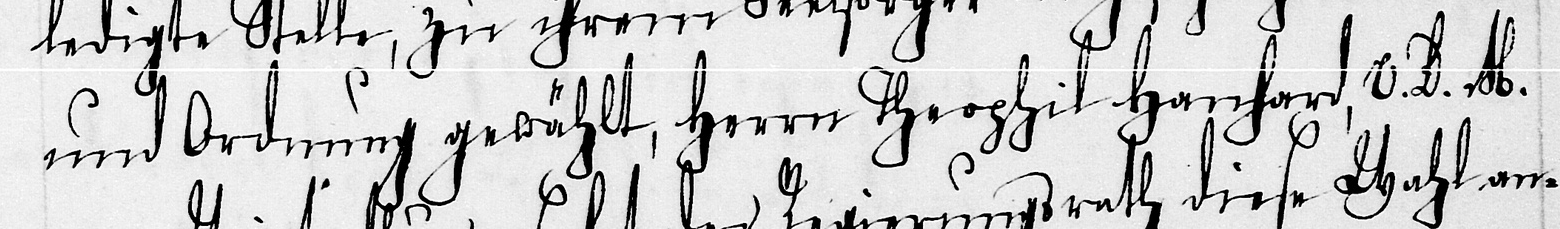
und Ordnung gewählt, Herrn Theophil Hanhard, V. D.
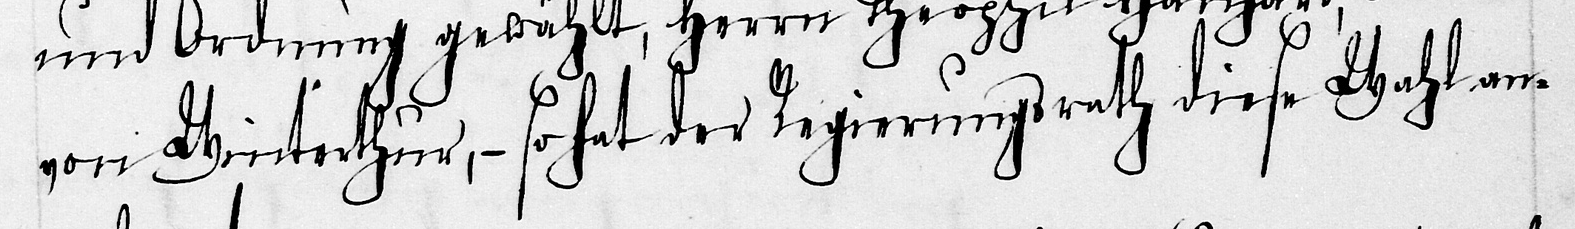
von Winterthur, – so hat der Regierungsrath diese Wahl an¬
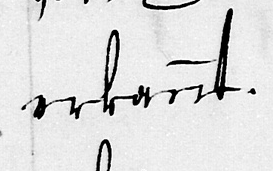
erkannt.
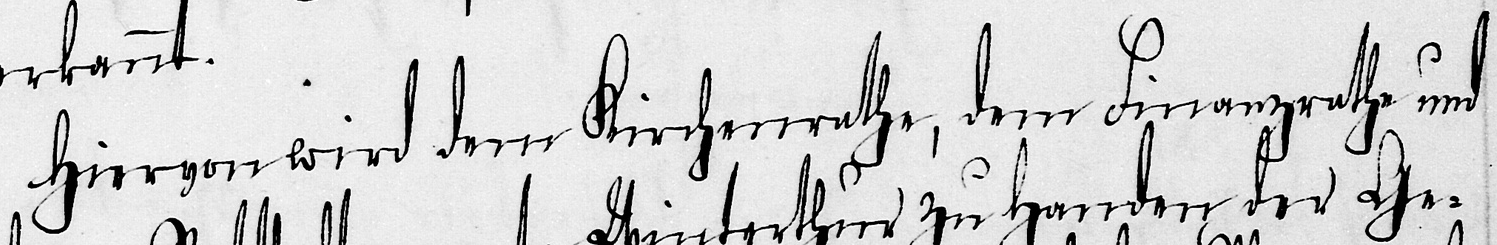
Hiervon wird dem Kirchenrathe, dem Finanzrathe und
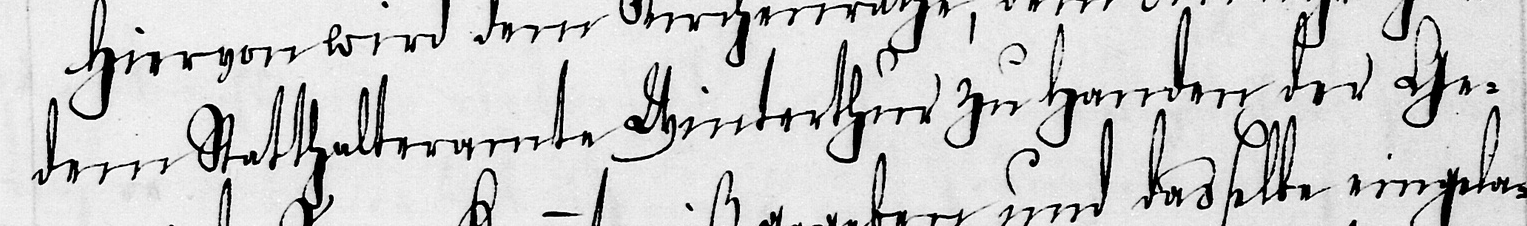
dem Statthalteramte Winterthur zu Handen der Ge¬
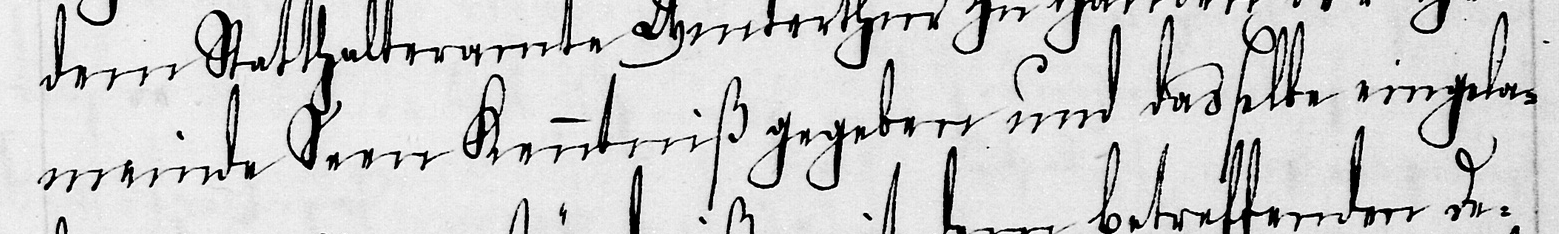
meinde Seen Kenntniß gegeben und dasselbe eingela¬
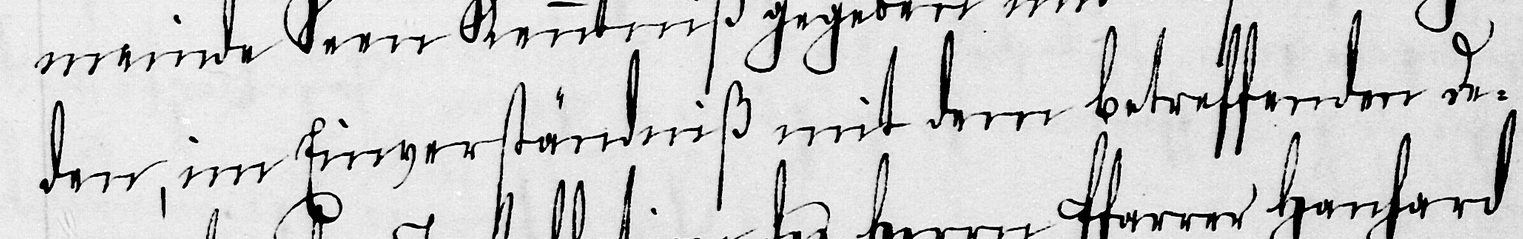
den, im Einverständniß mit dem betreffenden De¬
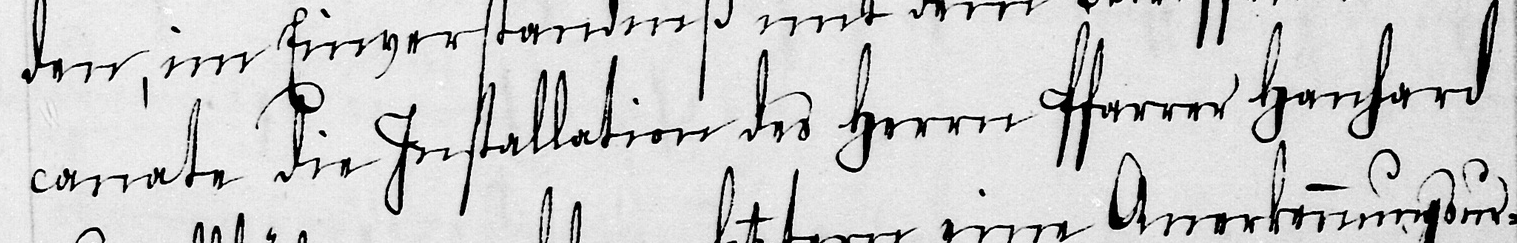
canate die Installation des Herrn Pfarrer Hanhard
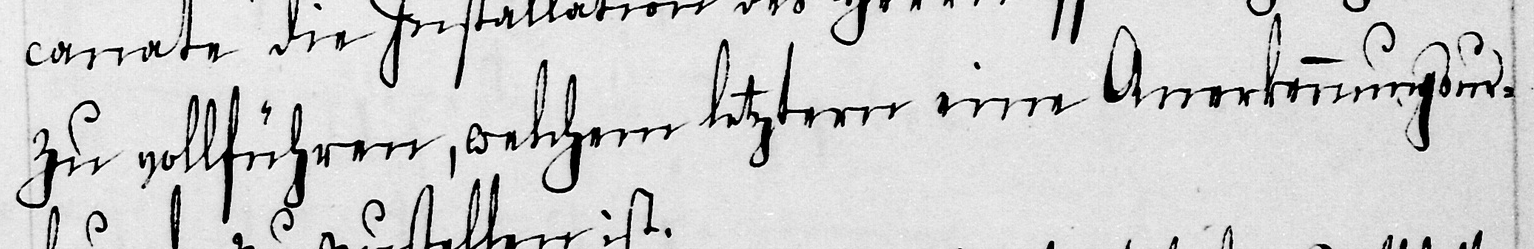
zu vollführen, welchem letztern eine Anerkennungsur¬
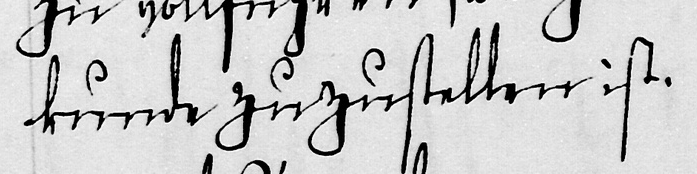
kunde zuzustellen ist.
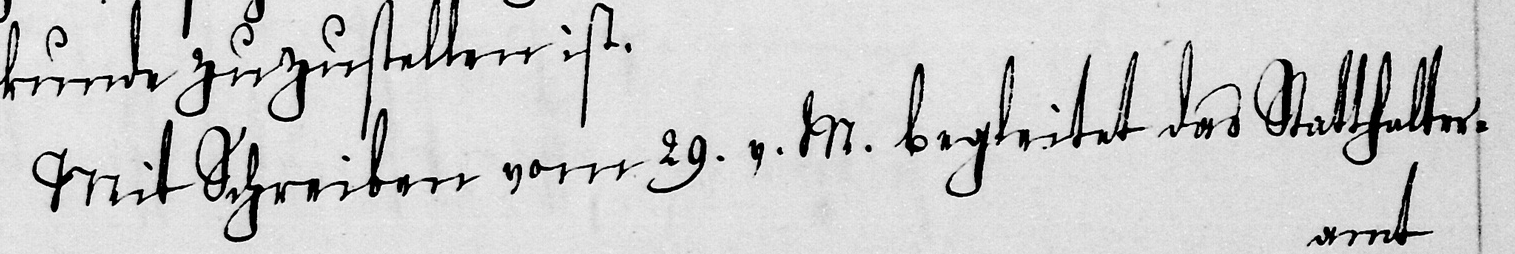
Mit Schreiben vom 29. v. M. begleitet das Statthalte¬
